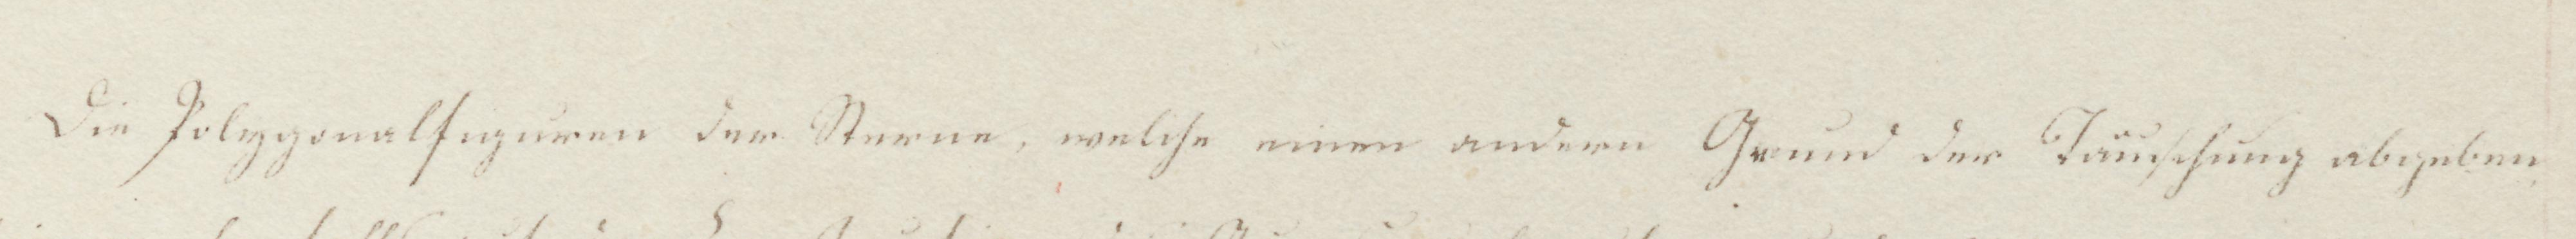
Die Polygonalfiguren der Sterne, welche einen andern Grund der Täuschung abgeben,
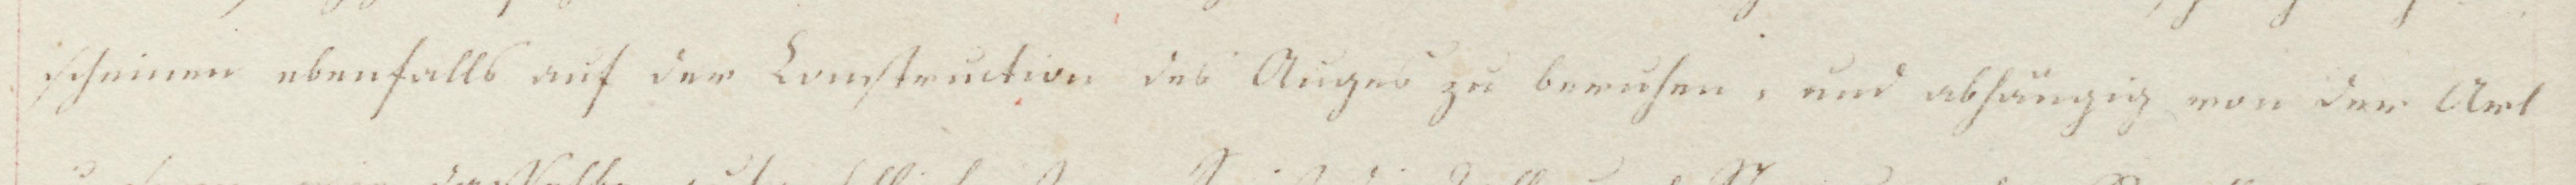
scheinen ebenfalls auf der Construction des Auges zu beruhen, und abhängig von der Art
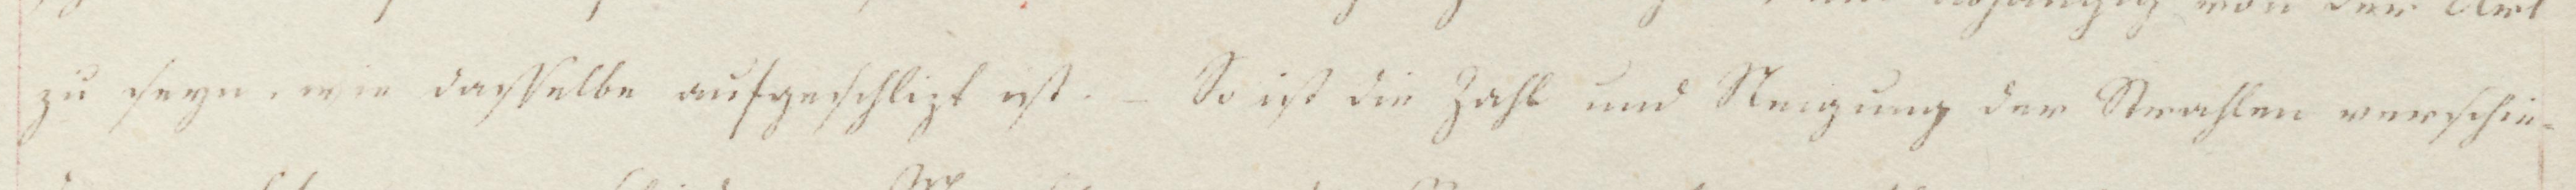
zu seyn, wie dasselbe aufgeschlizt ist. – So ist die Zahl und Neigung der Strahlen verschie-
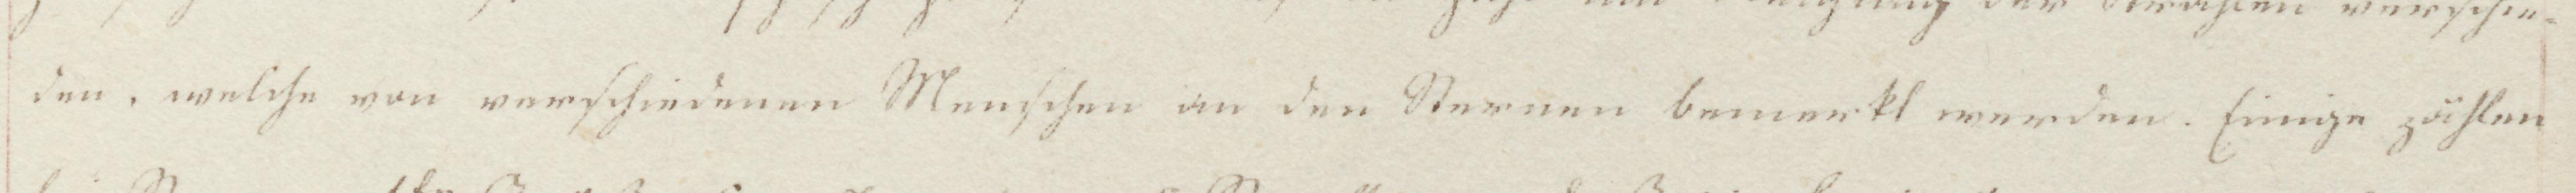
den, welche von verschiedenen Menschen an den Sternen bemerkt werden. Einige zählen
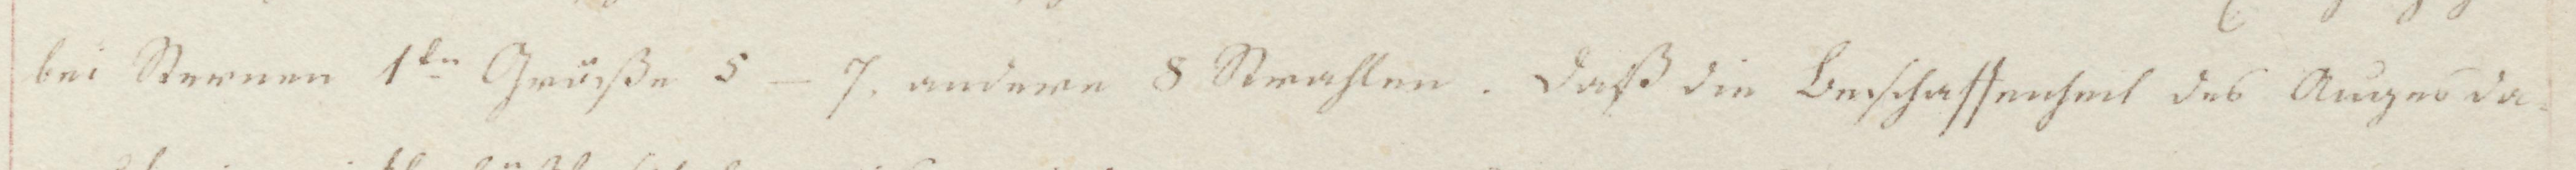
bei Sternen 1t￼ Größe 5–7, andere 8 Strahlen. Daß die Beschaffenheit des Auges da-
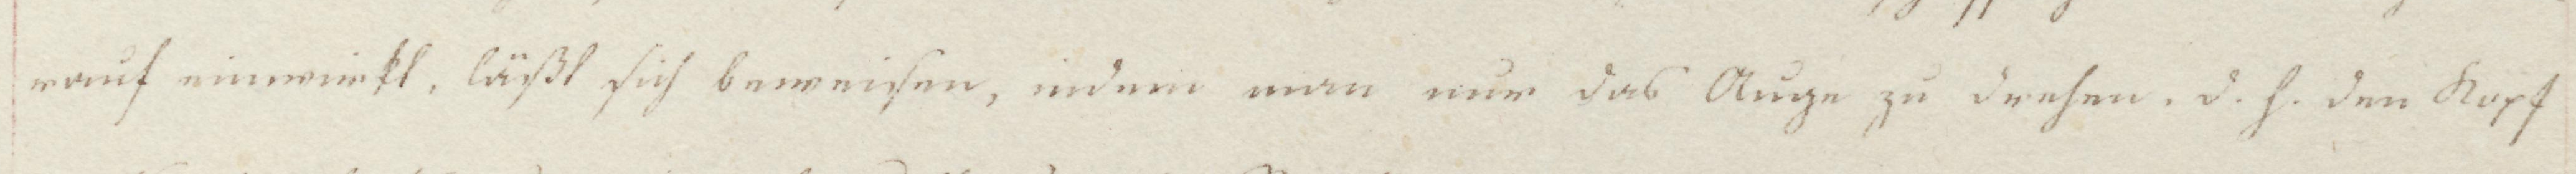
rauf einwirkt, läßt sich beweisen, indem man nur das Auge zu drehen, d. h. den Kopf
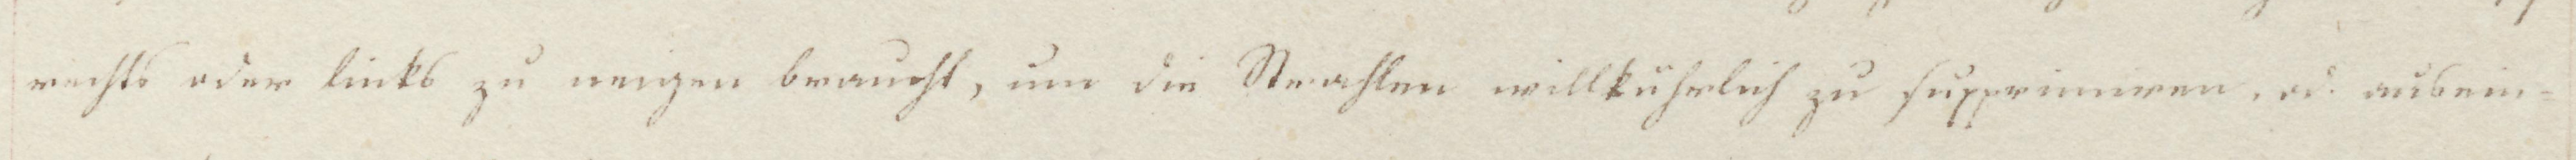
rechts oder links zu neigen braucht, um die Strahlen willkürlich zu supprimiren, od. ausein-
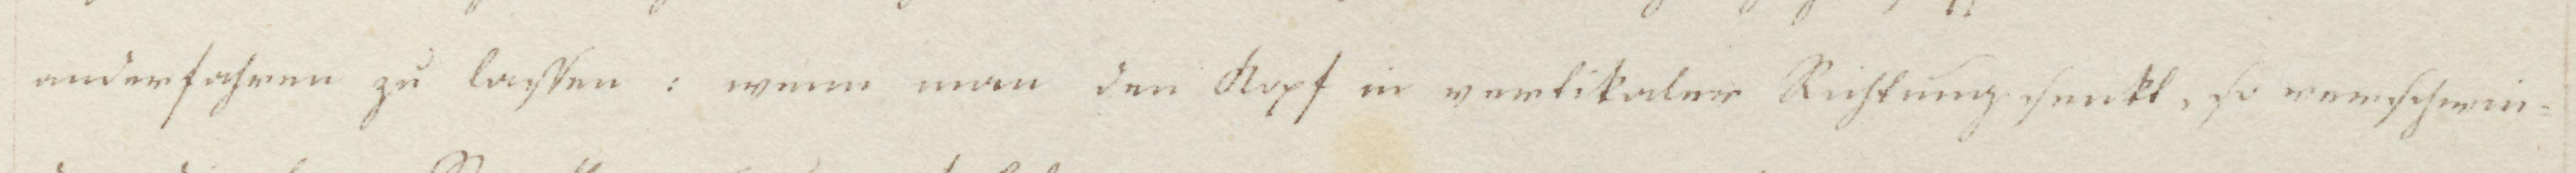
anderfahren zu lassen: wenn man den Kopf in vertikaler Richtung senkt, so verschwin-
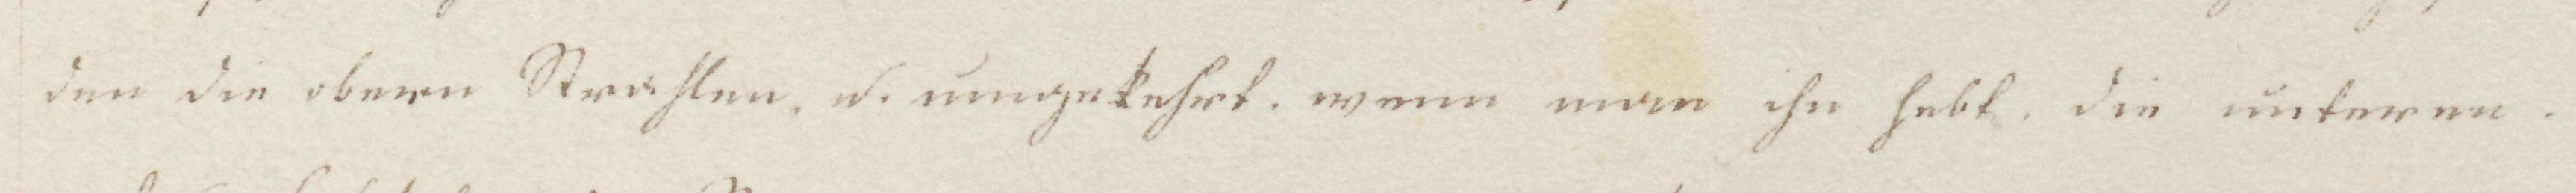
den die obern Strahlen, u. umgekehrt, wenn man ihn hebt, die unteren.
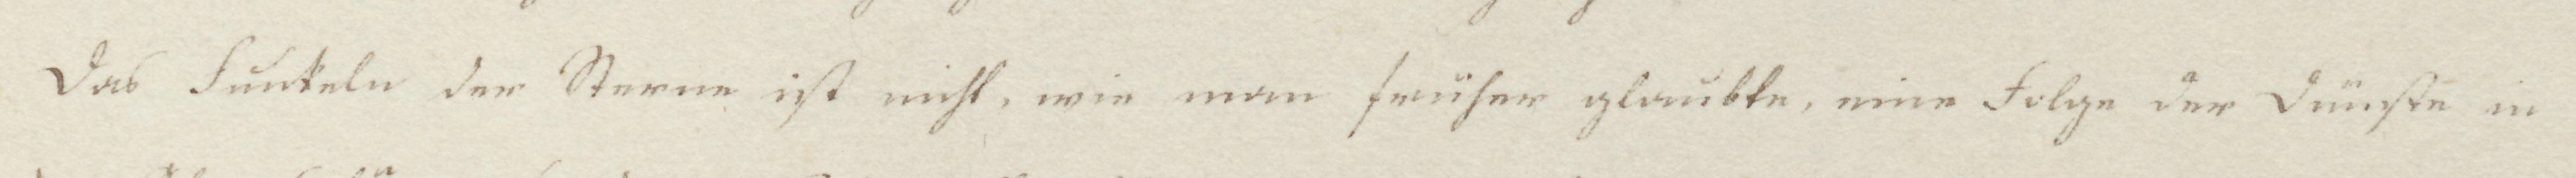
Das Funkeln der Sterne ist nicht, wie man früher glaubte, eine Folge der Dünste in
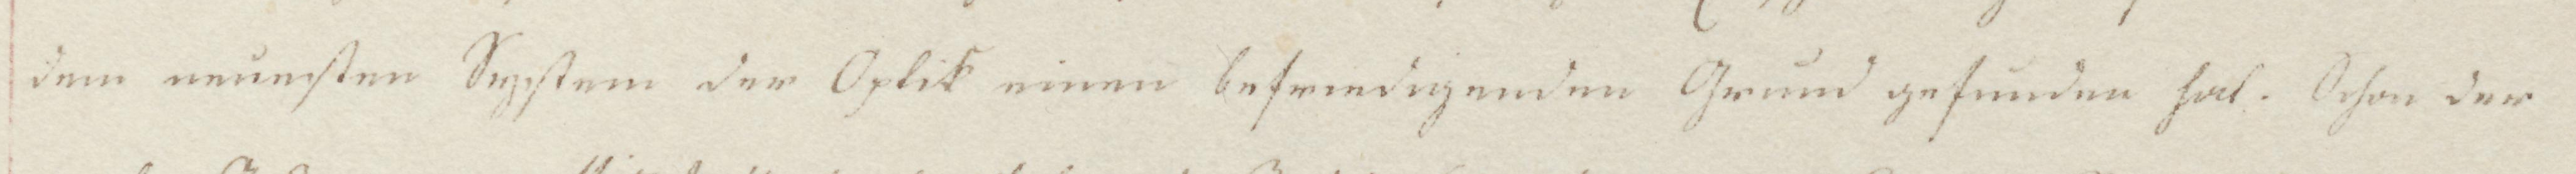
dem neuesten System der Optik einen befriedigenden Grund gefunden hat. Schon der
